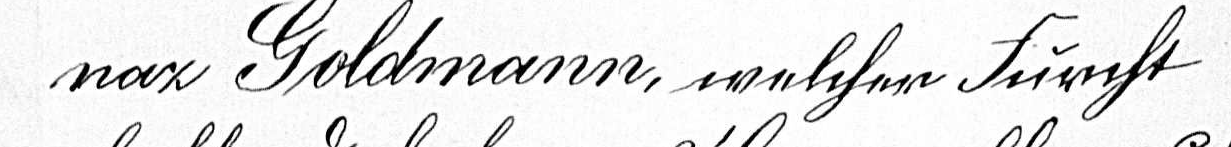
naz Goldmann, welcher Furcht
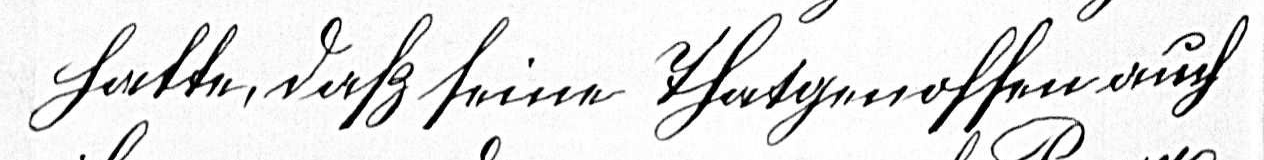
hatte, daß seine Thatgenossen auch
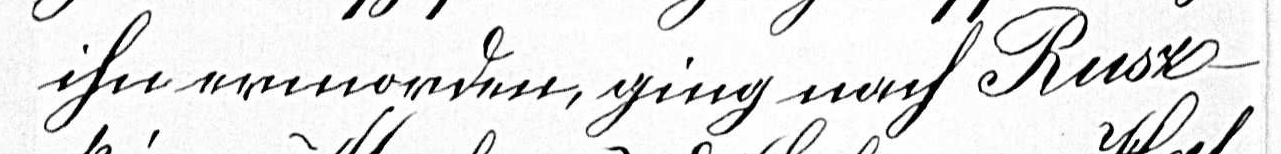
ihn ermorden, ging nach Rusz¬
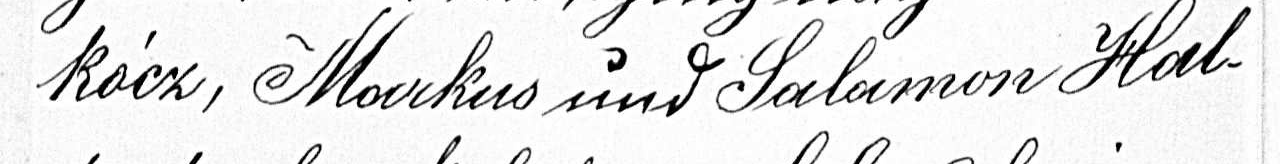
kócz, Markus und Salamon Hal¬
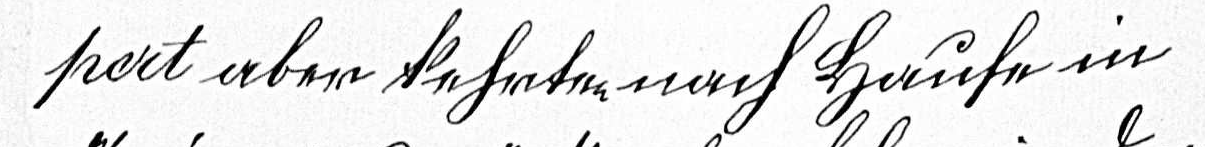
pert aber kehrten nach Hause in
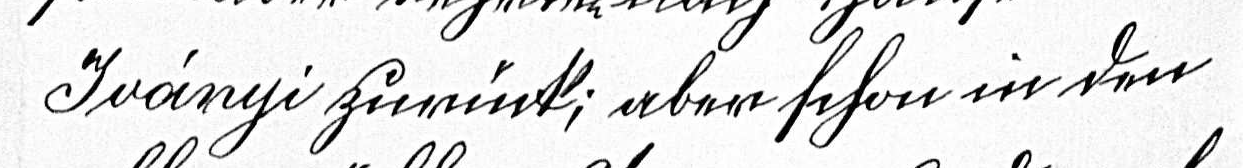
Jványi zurück; aber schon in den
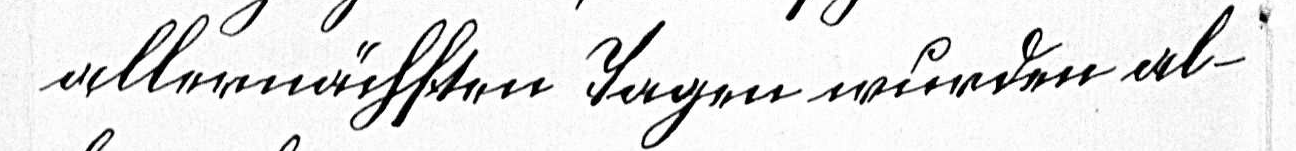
allernächsten Tagen wurden al¬
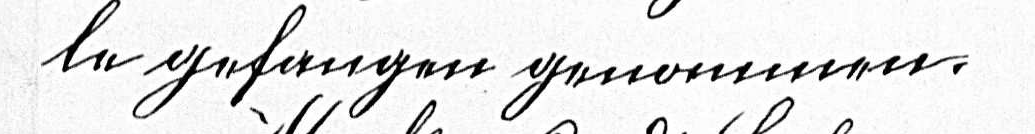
le gefangen genommen.
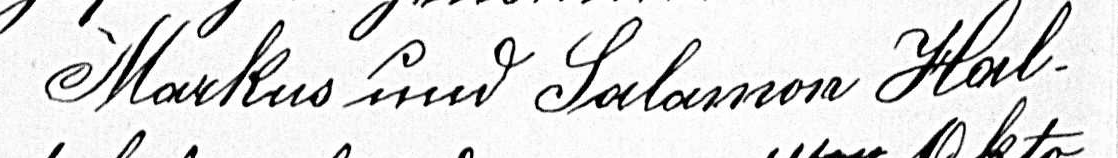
Markus und Salamon Hal¬
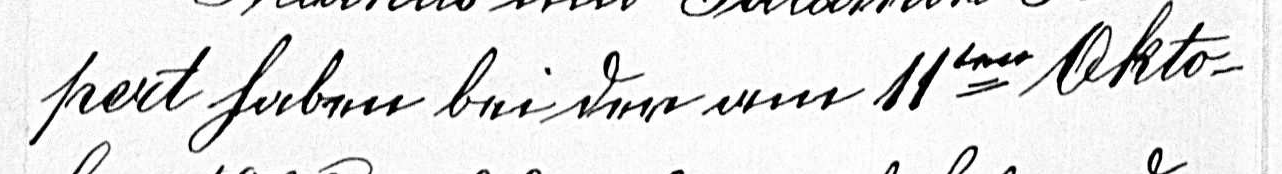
pert haben bei der am 11ten Okto¬
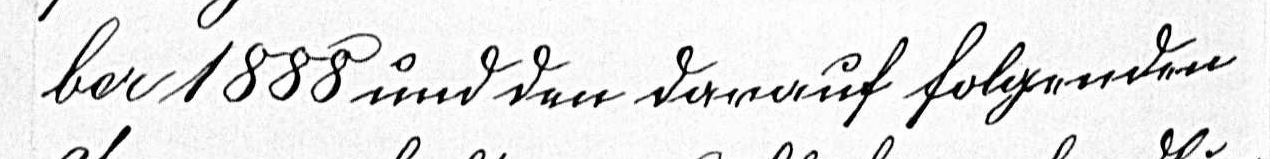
ber 1888 und den darauf folgenden
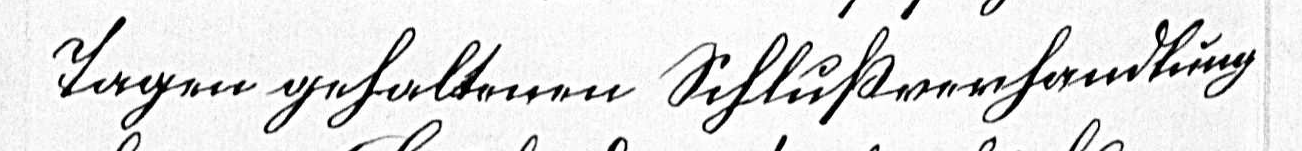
Tagen gehaltenen Schlußverhandlung
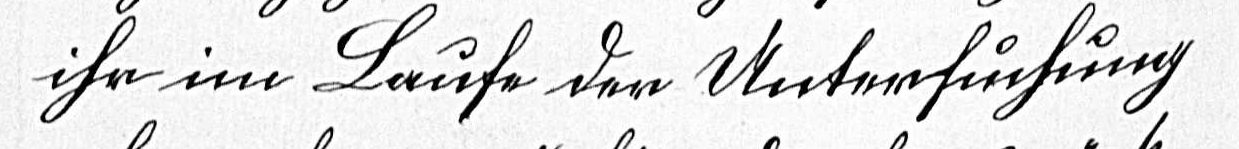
ihr im Laufe der Untersuchung
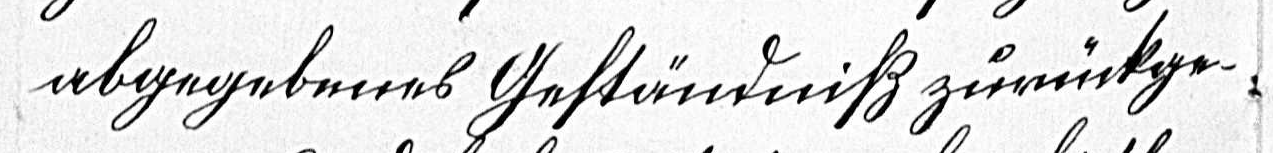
abgegebenes Geständniß zurückge¬
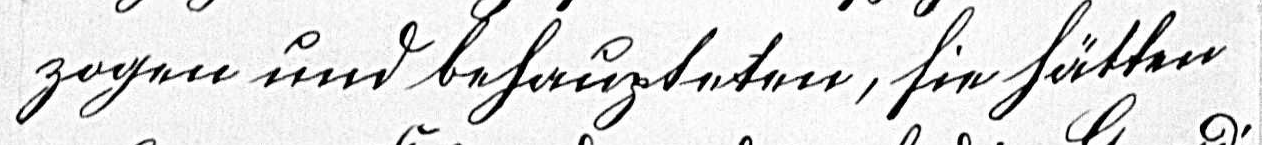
zogen und behaupteten, sie hätten
